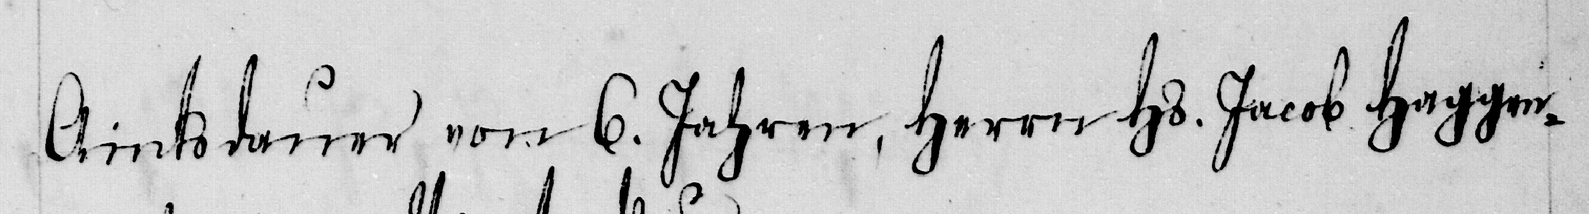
Amtsdauer von 6. Jahren, Herrn Hs. Jacob Haggen¬
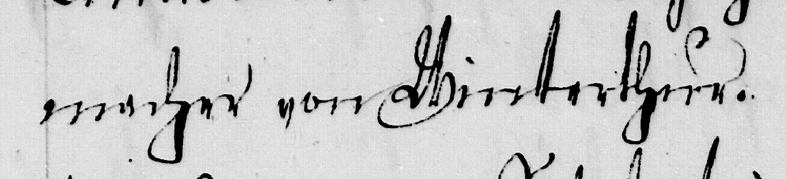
macher von Winterthur.
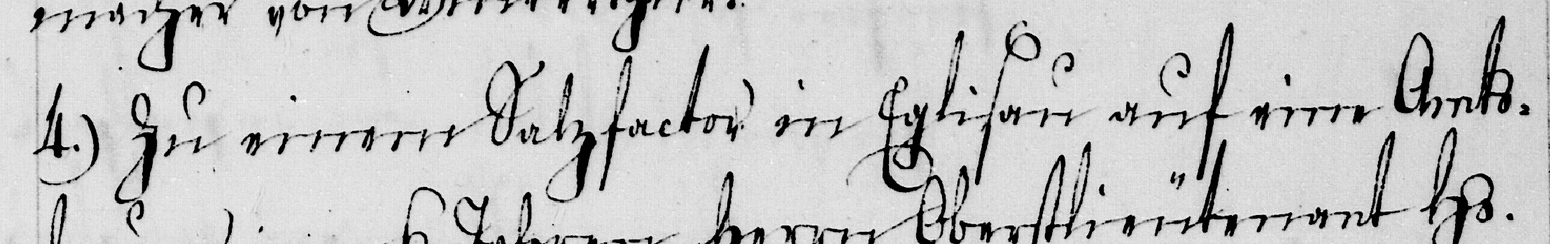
4.) Zu einem Salzfactor in Eglisau auf eine Amts¬
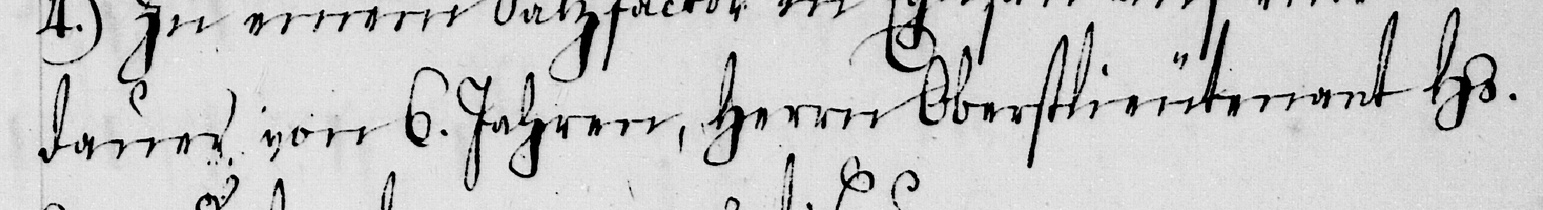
dauer von 6. Jahren, Herrn Oberstlieutnant Hs.
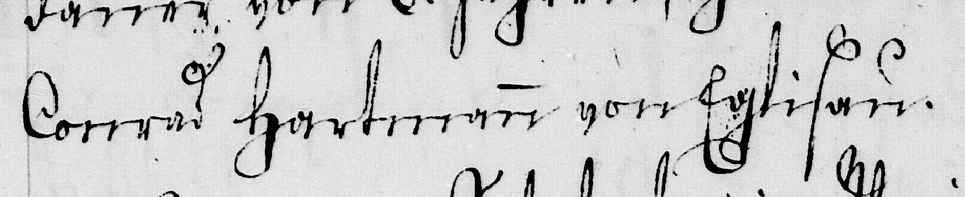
Conrad Hartmann von Eglisau.
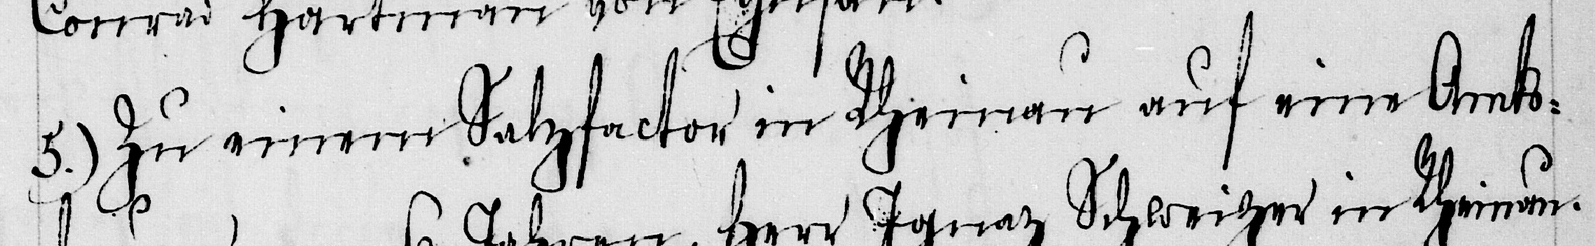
5.) Zu einem Salzfactor in Rheinau auf eine Amts¬
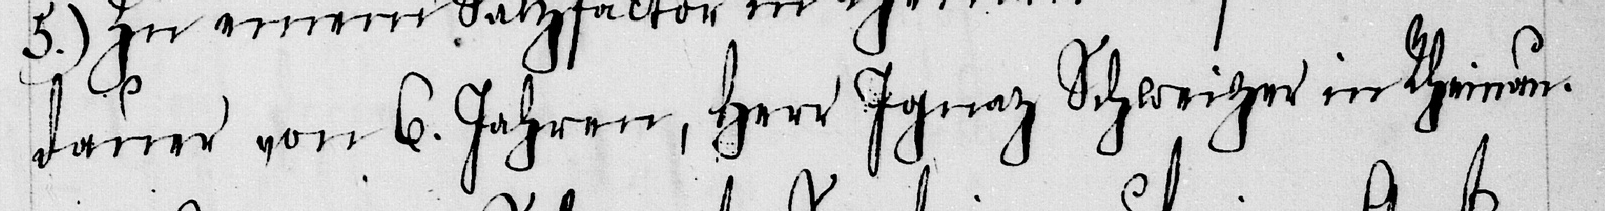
dauer von 6. Jahren, Herr Ignaz Schweizer in Rheinau.
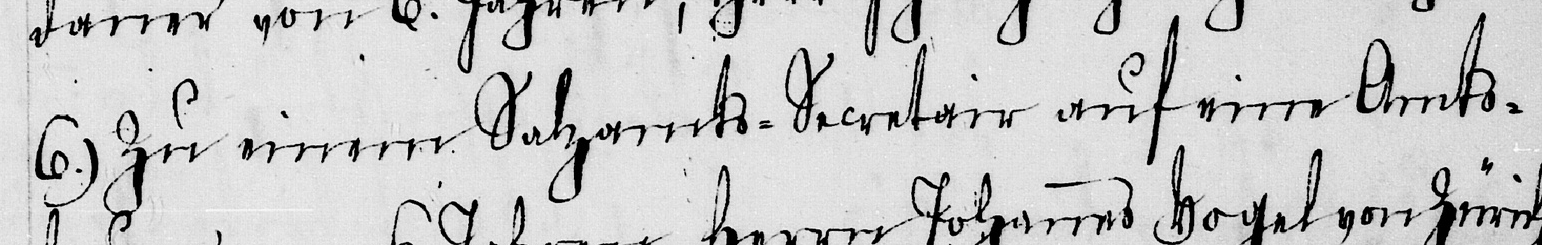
6.) Zu einem Salzamts-Secretair auf eine Amts¬
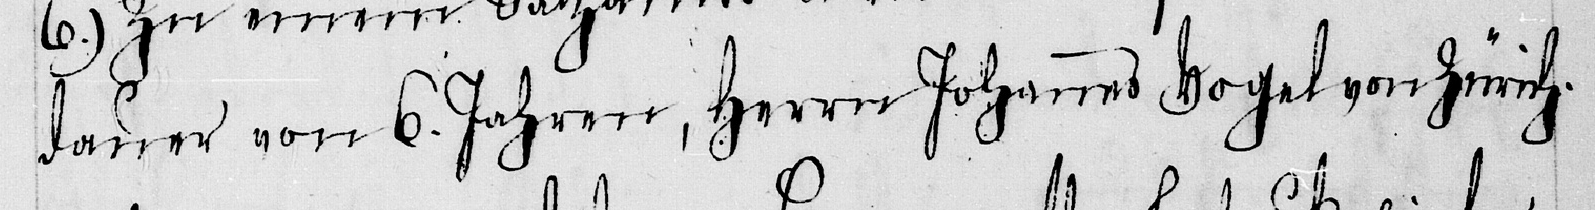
dauer von 6. Jahren, Herrn Johannes Vogel von Zürich.
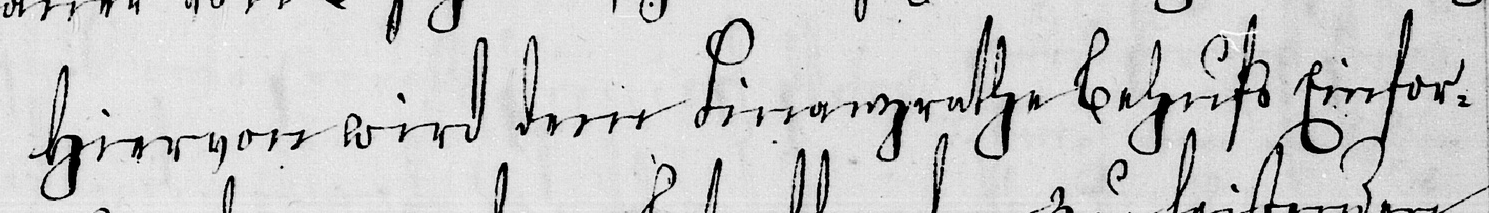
Hiervon wird dem Finanzrathe Behufs Einfor¬
